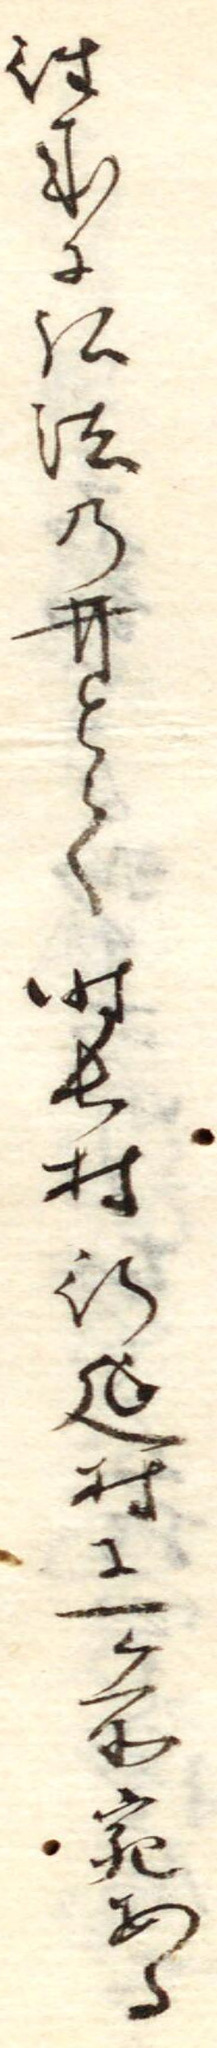往来に弘法の井とて時長村行延村に一ヶ所宛ある
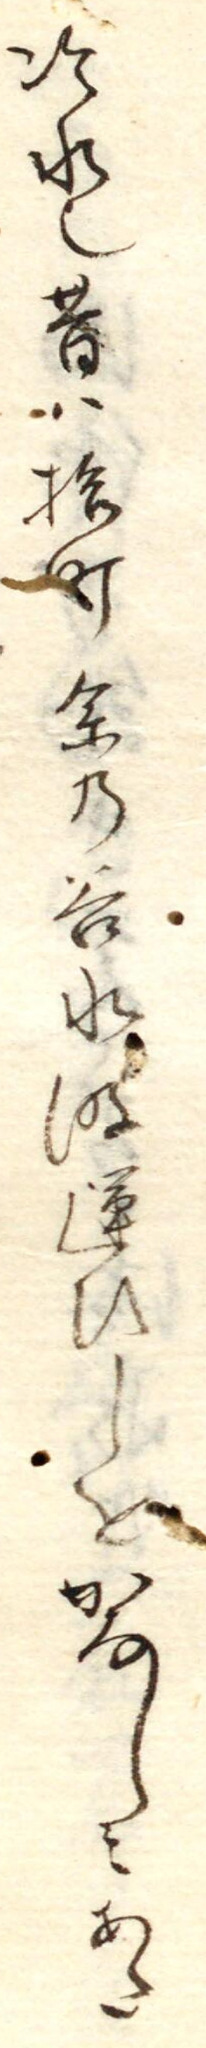冷水也昔は拾町余の谷水汲運ひしをかなしみあた
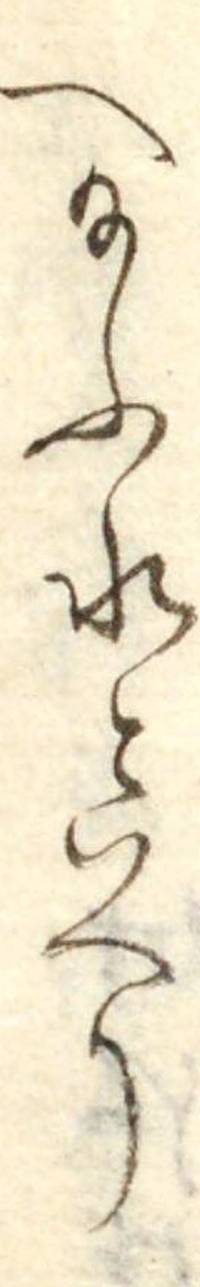へ給ふ水といへり
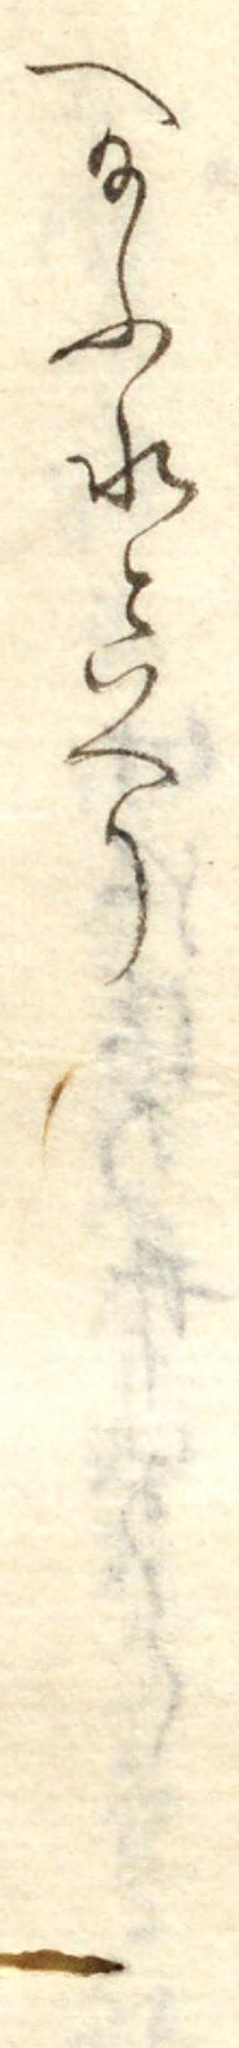へ給ふ水といへり

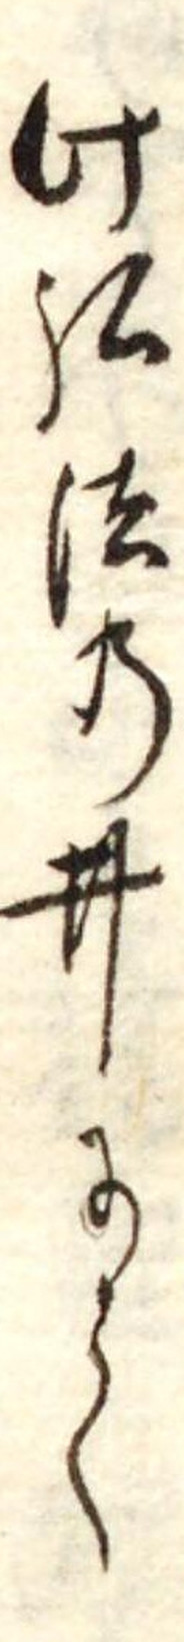此弘法の井にて
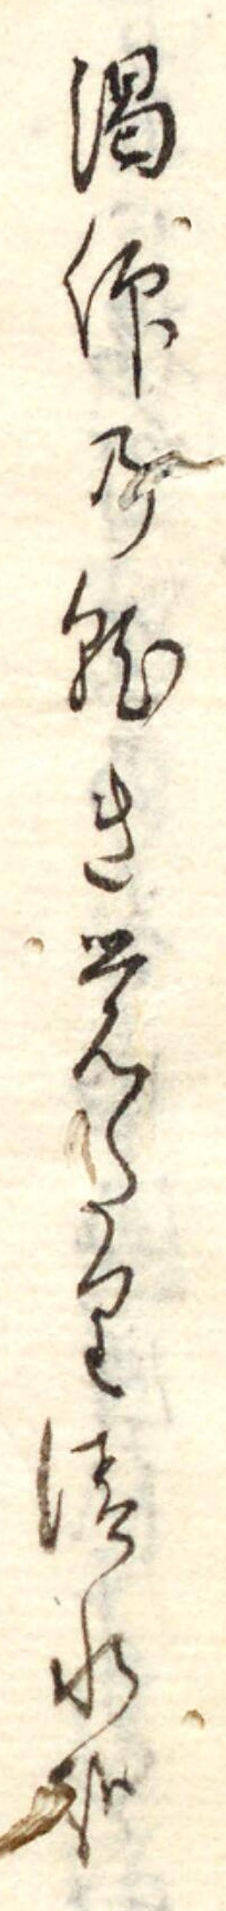渇仰の就き覚たり清水を
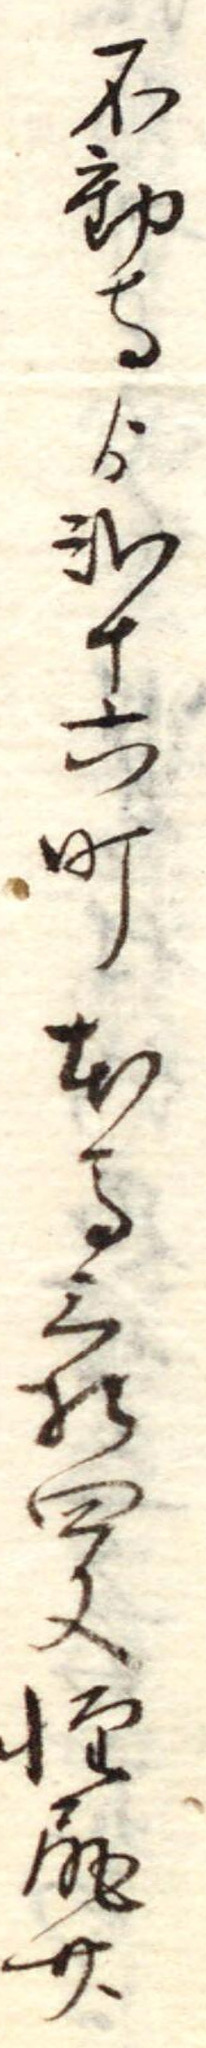不動寺ゟ弐十六町本馬三拾四文軽尻廿
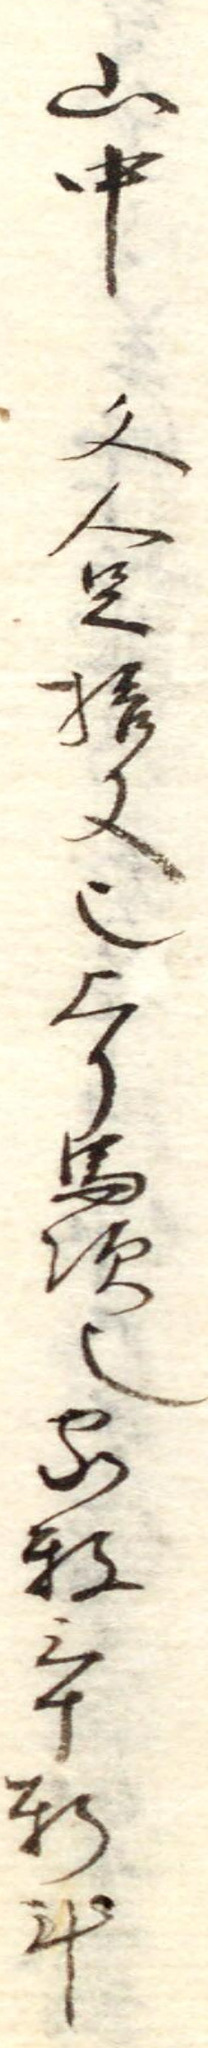山中文人足拾文也上り馬次也家数三十軒斗
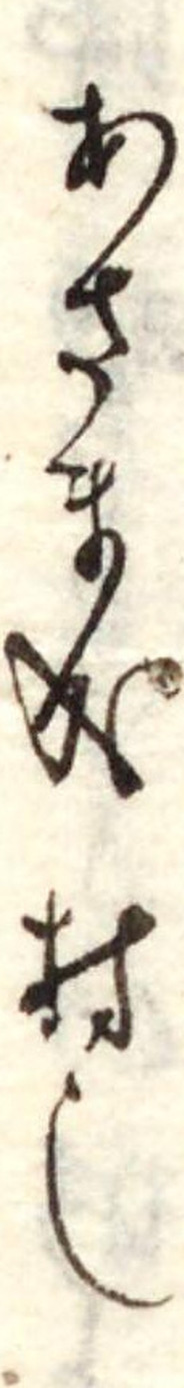あさま成村也勒
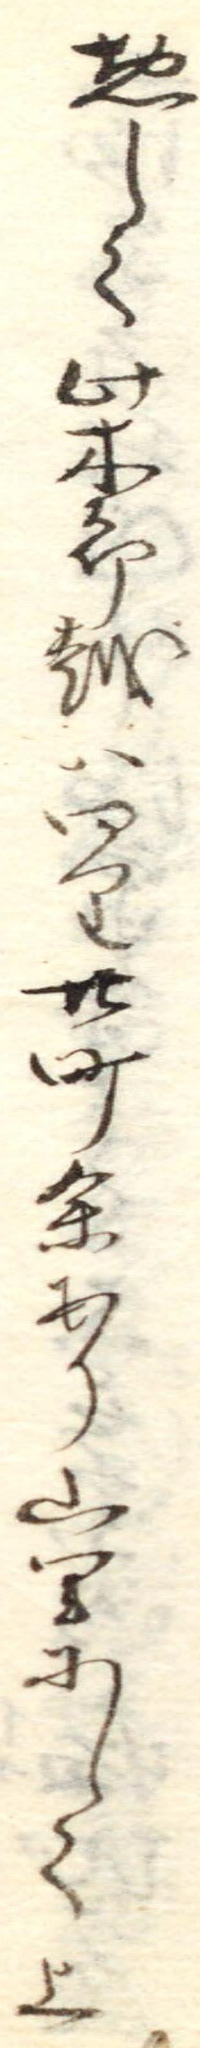惣して此木郎越は四里廿町余あり山里にして上
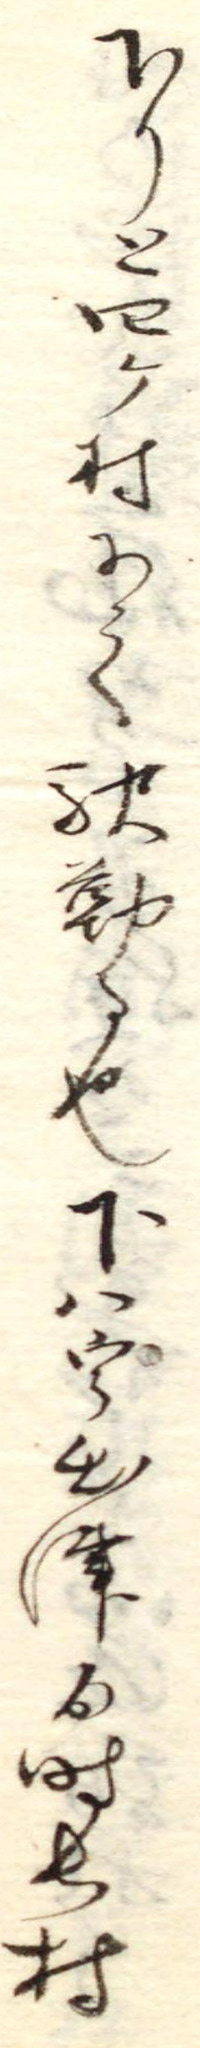下りと四ヶ村にて駅勒る也下は宇出津ゟ時長村
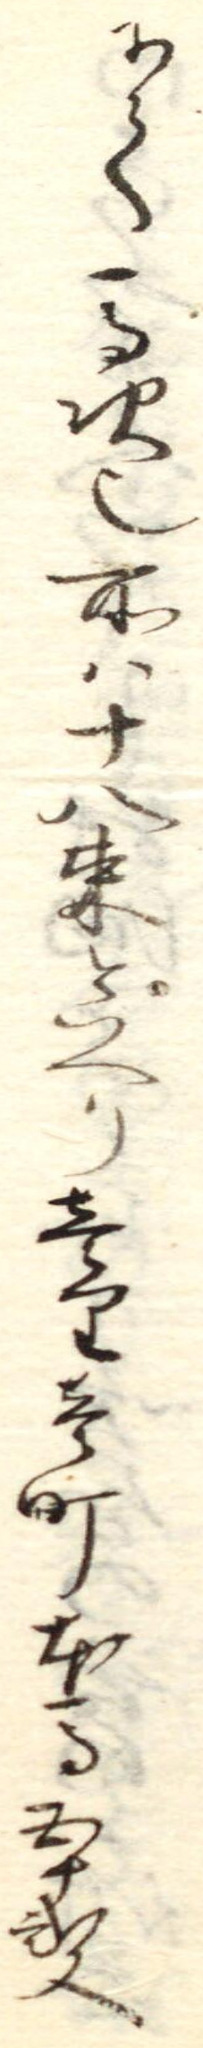にて馬次也所は十八束といへり壱里壱町本馬五十弐文
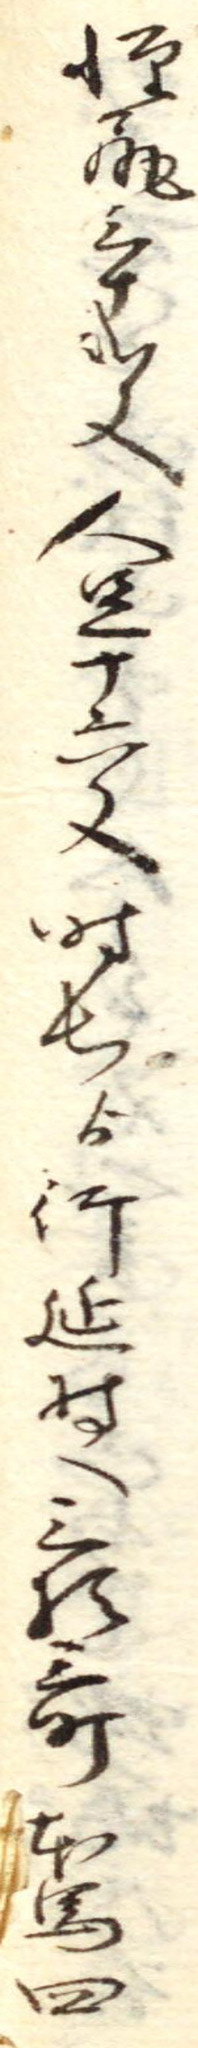軽尻三十弐文人足十六文時長ゟ行延村へ三拾三町本馬
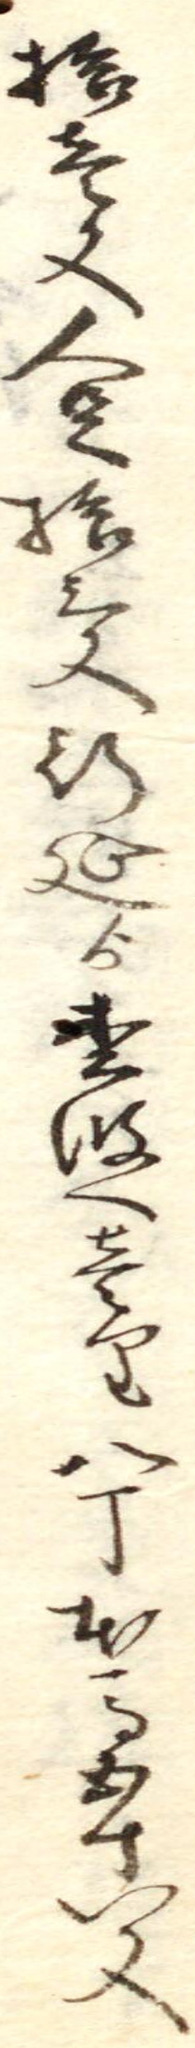拾壱文人足拾三文行延ゟ枩波へ壱里八丁本馬五十八文
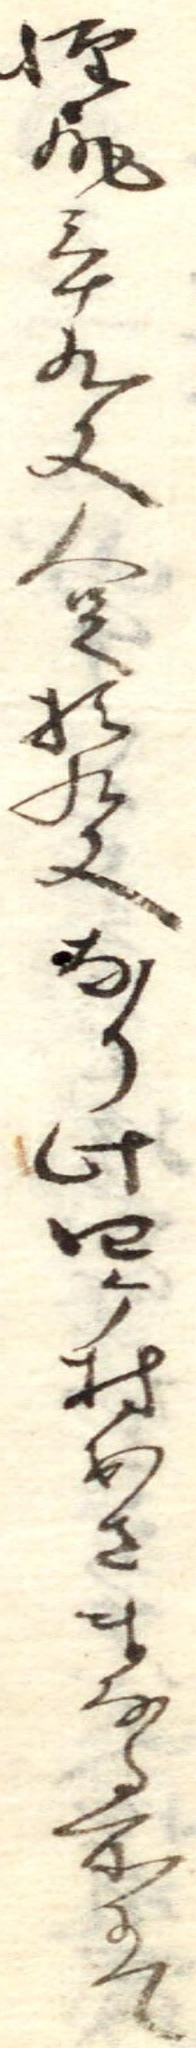軽尻三十九文人足拾九文なり此四ヶ村あさまなる所にて
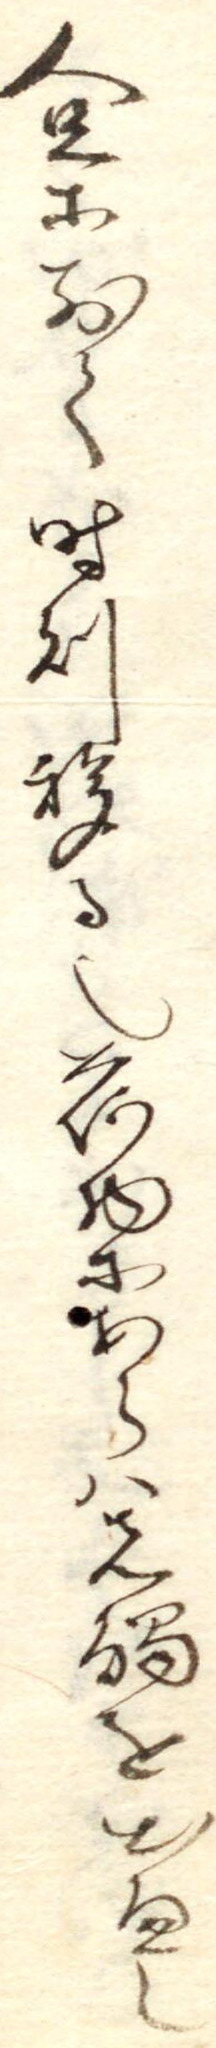人足等別て時則移る也荷物等あらは先触を出へし
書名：能登名跡誌
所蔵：Ishikawa Prefectural Library
